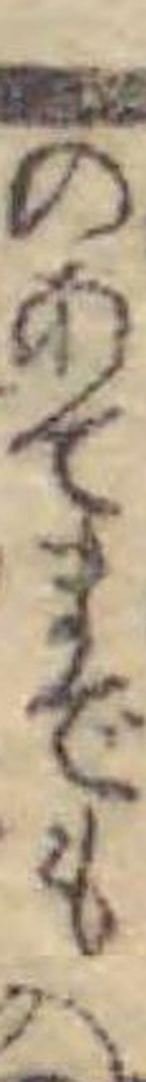のあてまでも
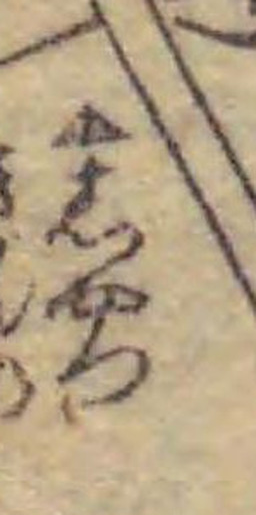▲しやつ
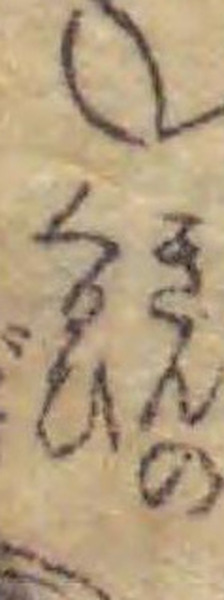くるひ
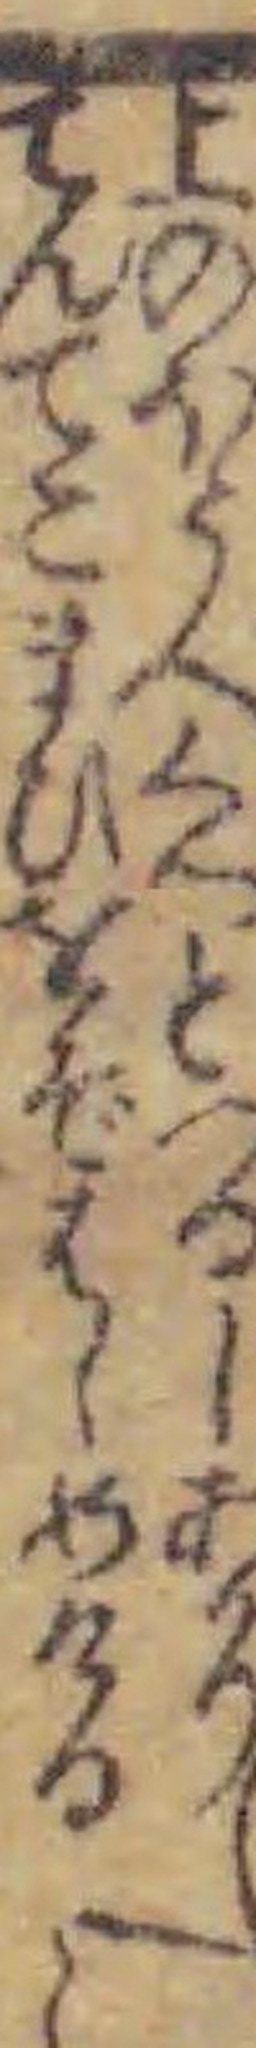てんてこまひをぞはしめける
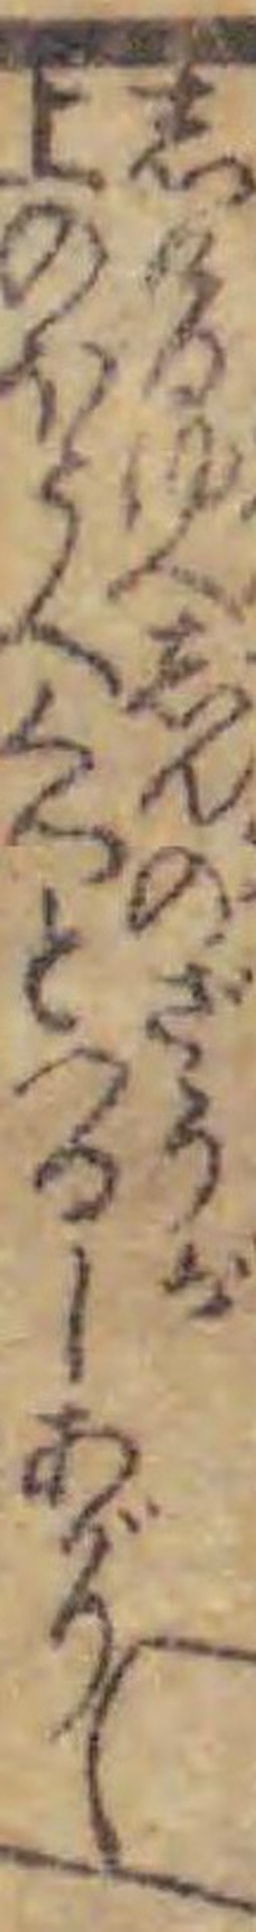上のほうへくつとつるしあがり
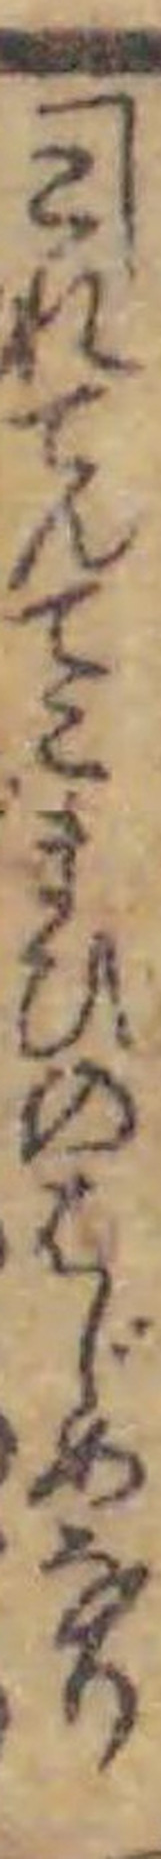〽これてんてこまひのはじめなり
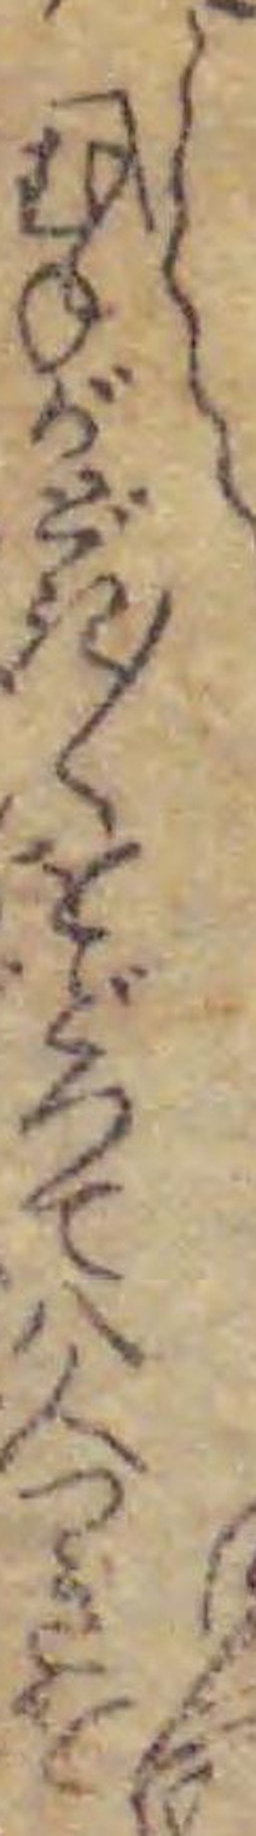〽むねがどき〳〵をどつて八人つきを
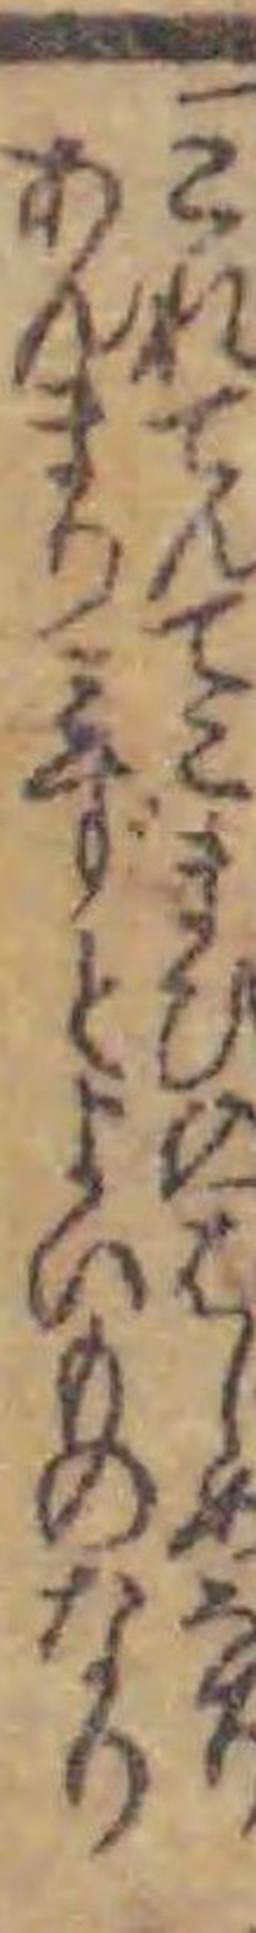あんまりみずとよいものなり
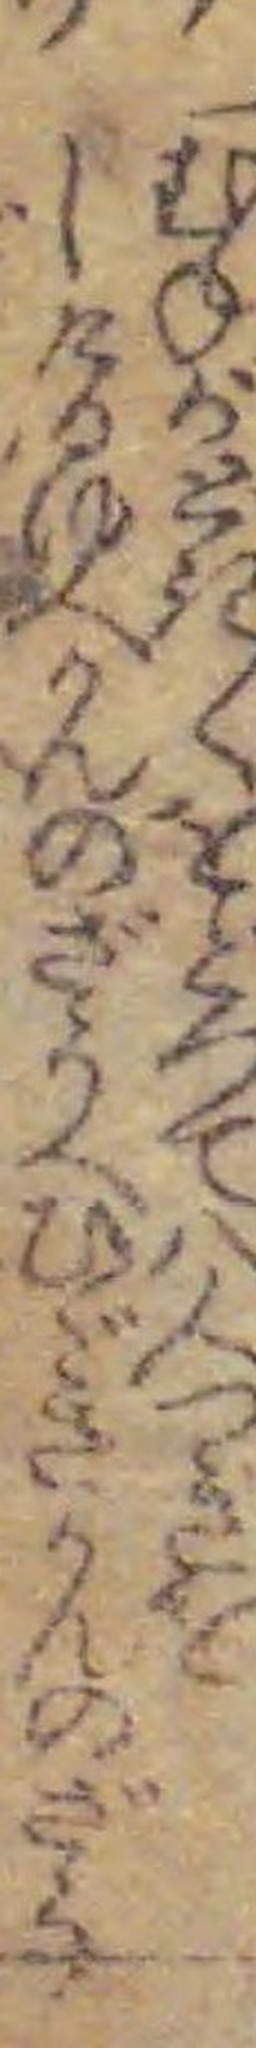しけるゆへかんのざうへひゞきかんのざう
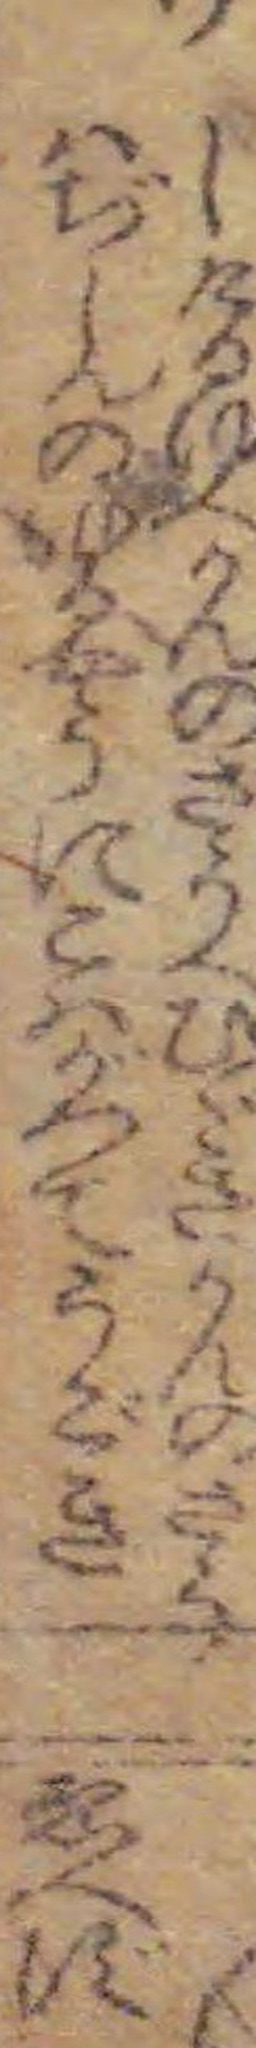はぢしんのゆるやうにこはがつてうごきゑへず

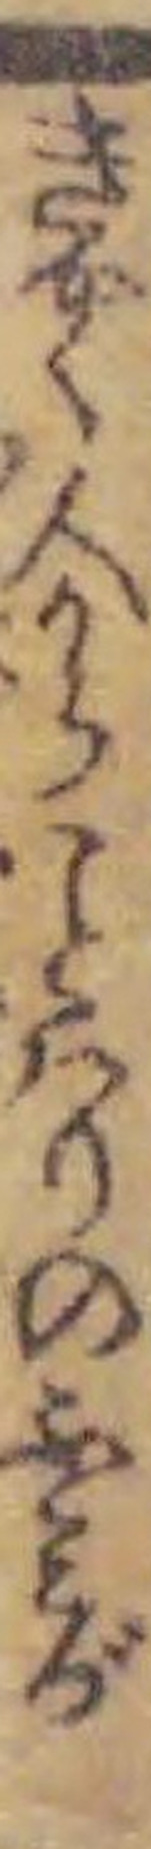きやく人からことはりのふみが
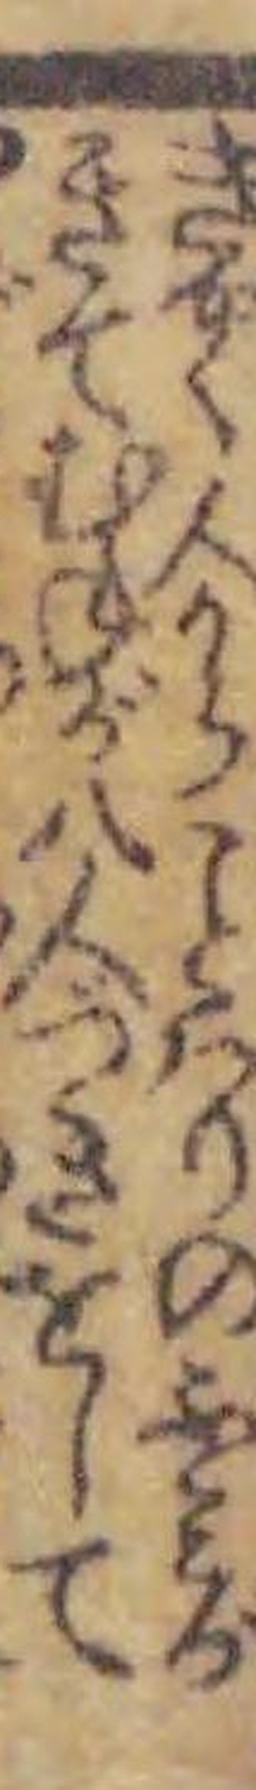きてむねが八人づきをして
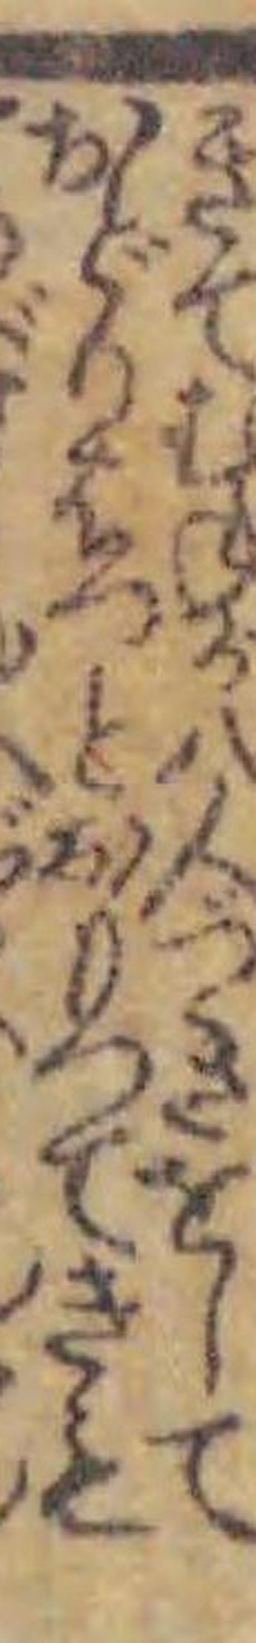おどりはつとおもつてきも
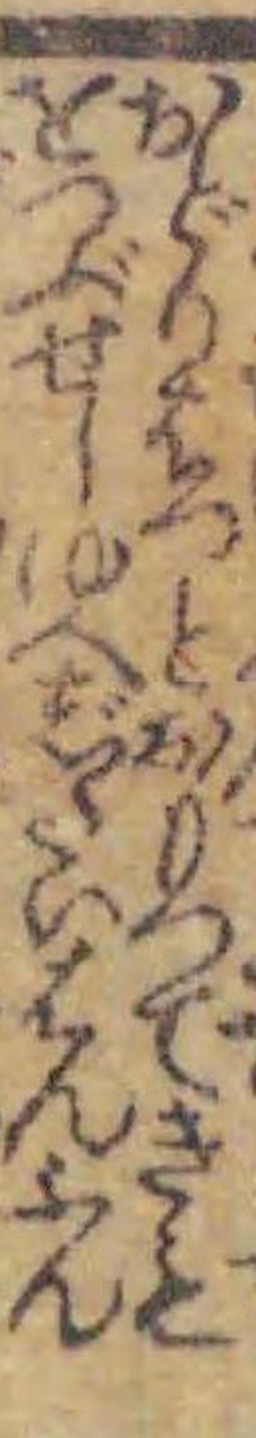をつぶせしゆへじたいはんふん
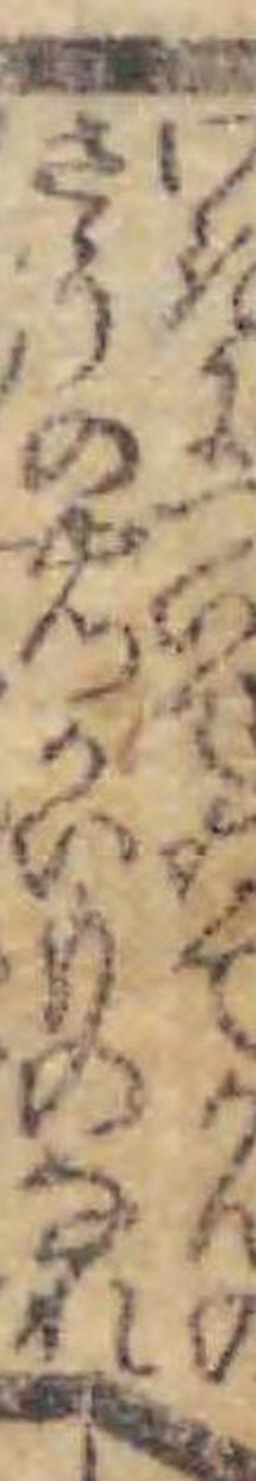さうのやつかいものなれ
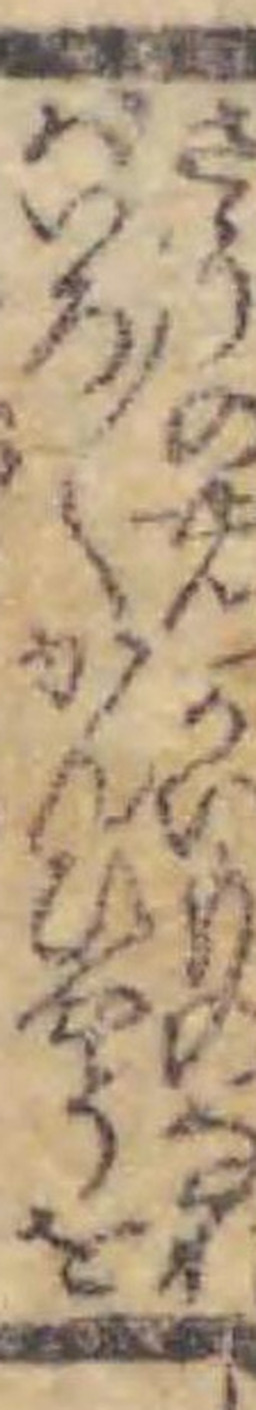ばいろ〳〵かんひやうを
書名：十四傾城腹之内 : 3巻
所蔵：国立国会図書館 National Diet Library, JAPAN
